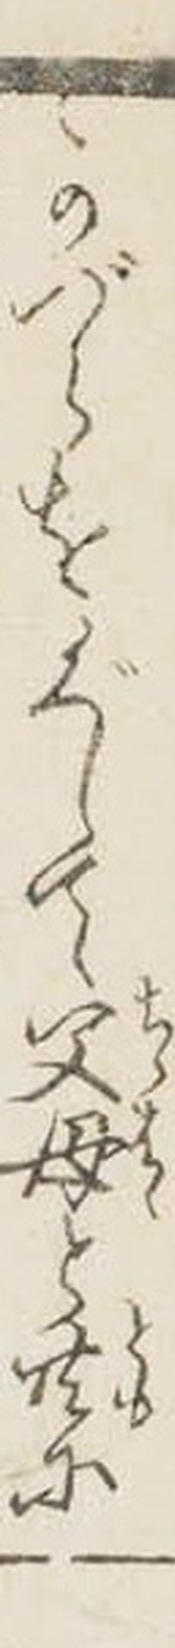かづらをぐして父母と共に
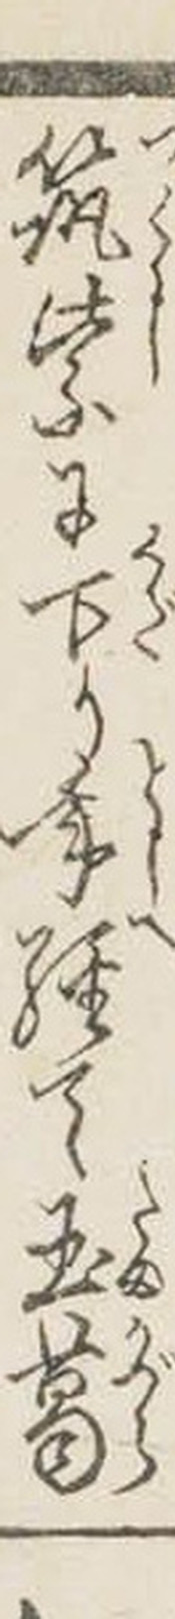筑紫に下り年経て玉葛
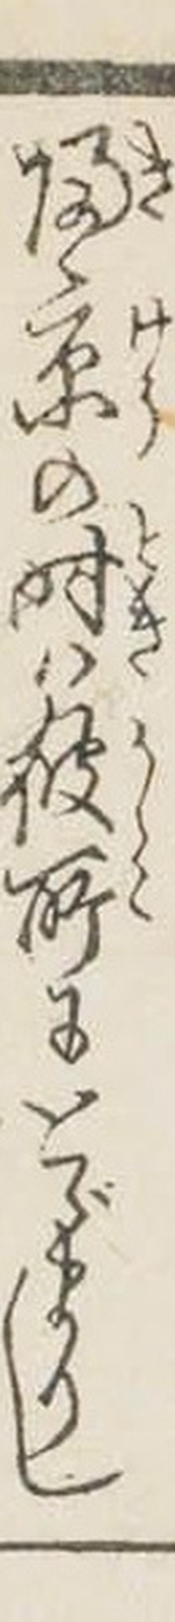帰京の時は彼所にとゞまりし
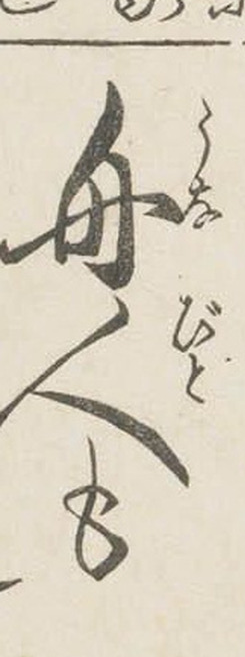舟人も
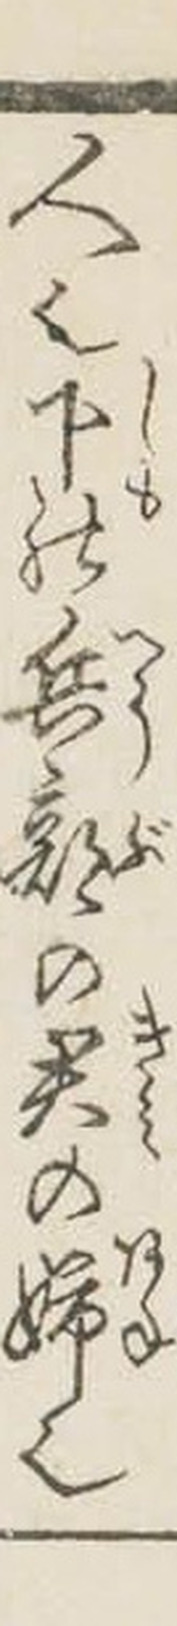人也下の兵部の君の姉也
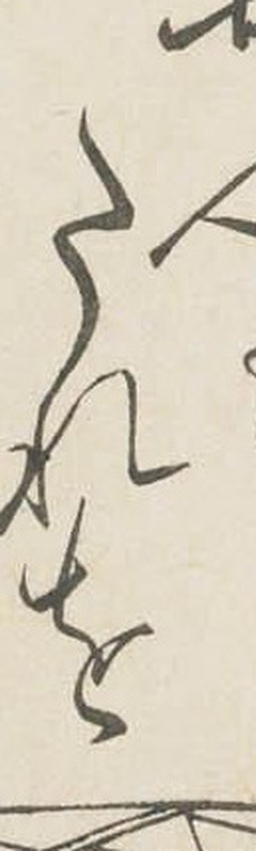たれを
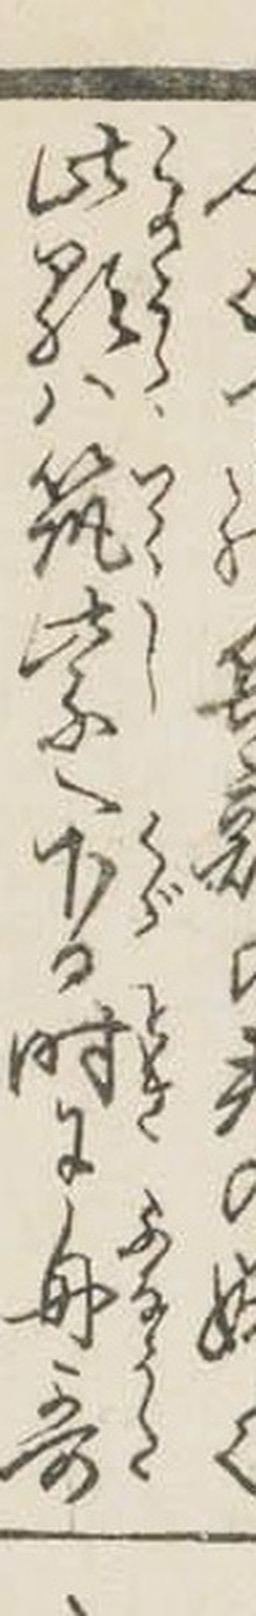此歌は筑紫へ下る時に舟哥
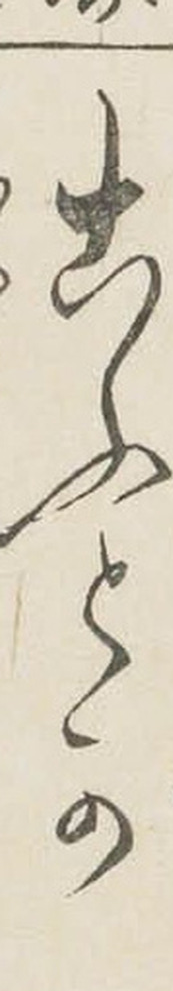こふとか
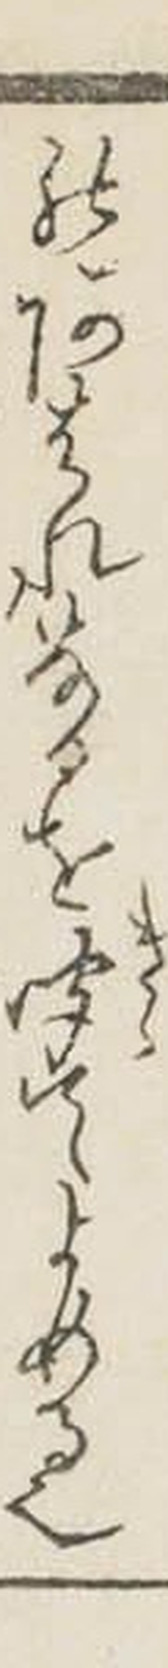のあはれなるを聞てよめる也
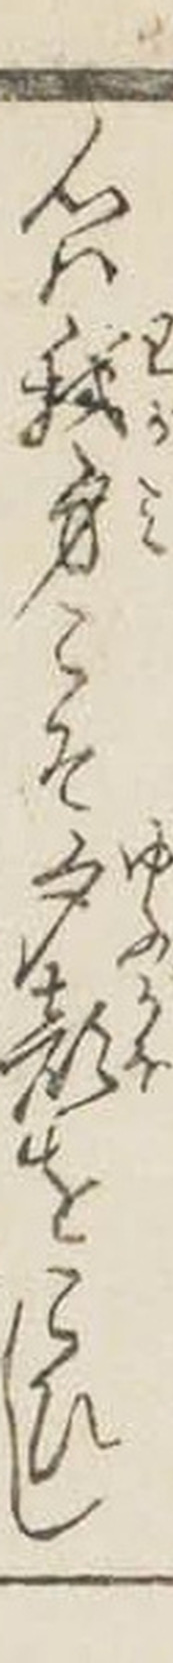心は我身こそ夕顔をこひし
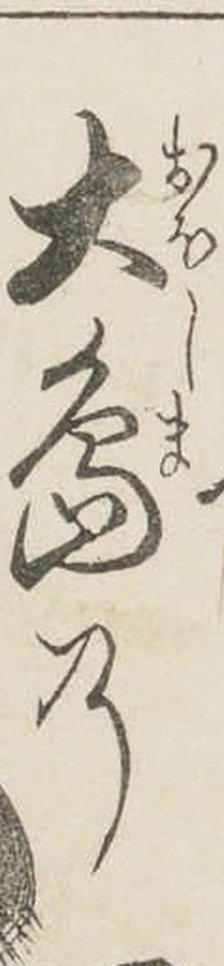大島の
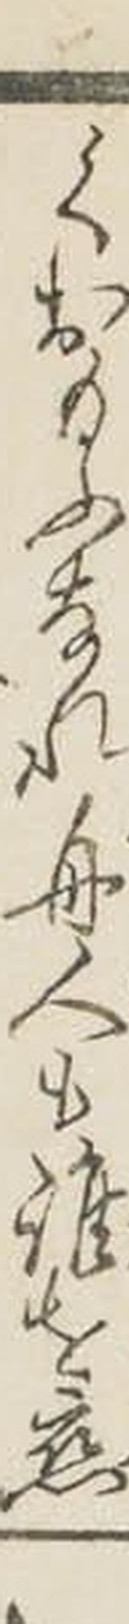くおもふなれ舟人も誰を恋
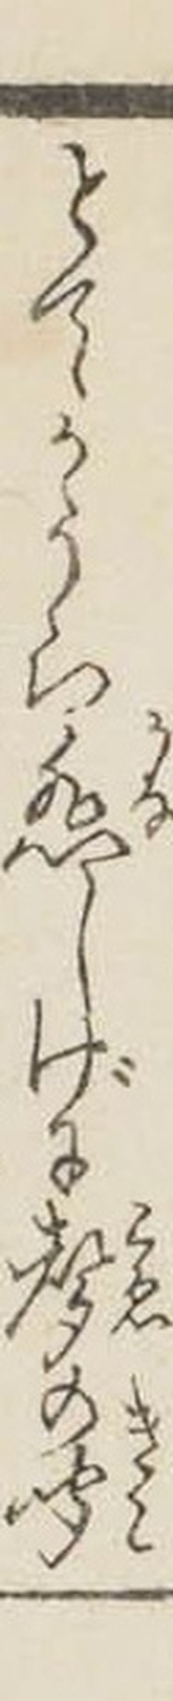とてかうら悲しげに声の聞
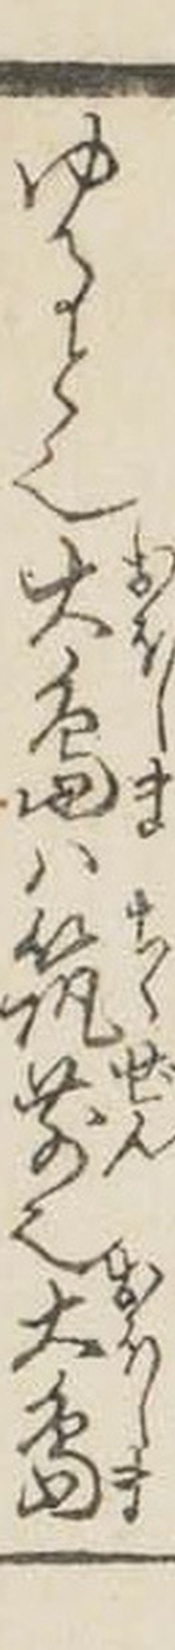ゆると也大島は筑前也大島
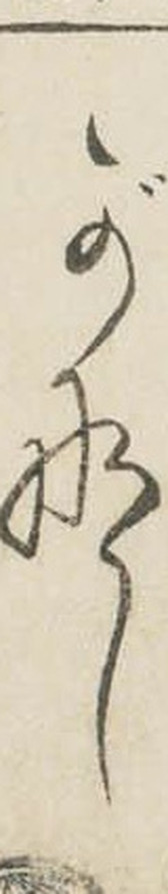がなし
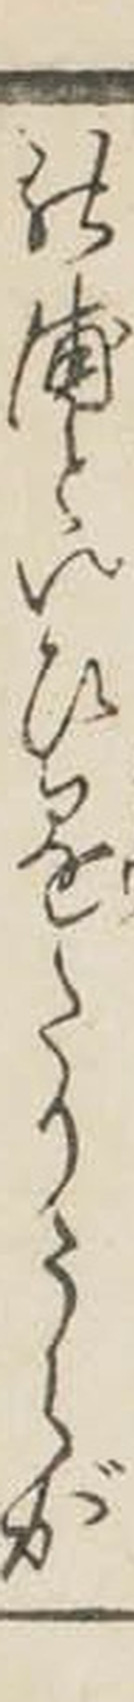の浦といひ懸たりうらが
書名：源氏百人一首
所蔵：東京学芸大学教育コンテンツアーカイブ
